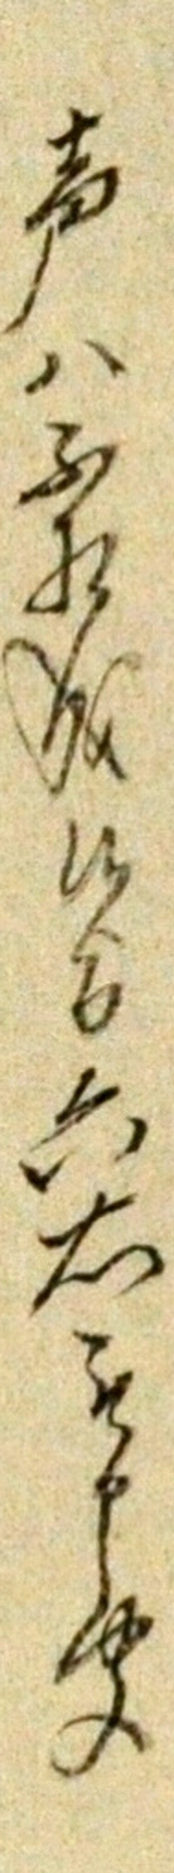声は不相成候旨六右被申聞
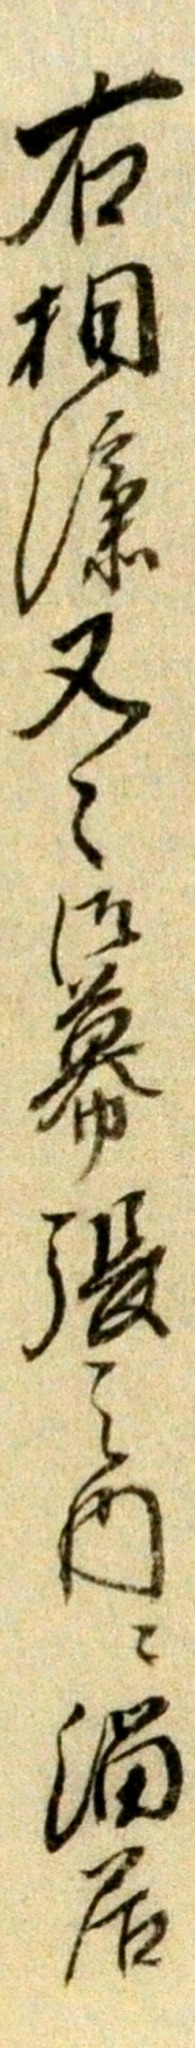右相済又々御幕張之内に溜居
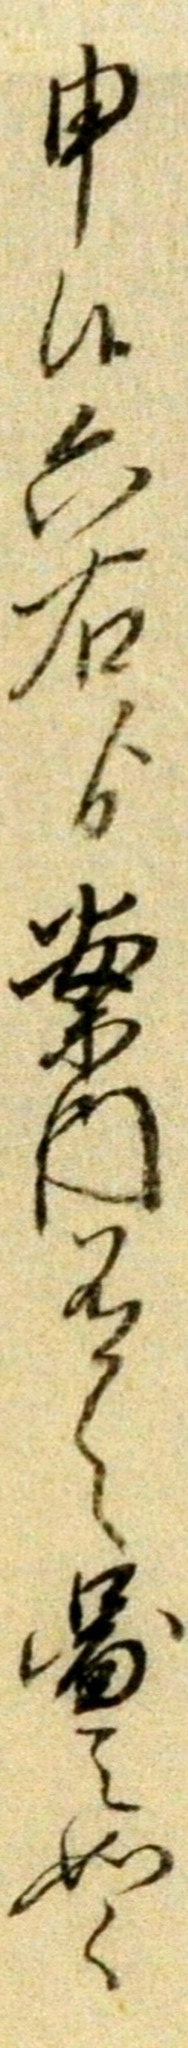申候六右ゟ案内有之図之如く
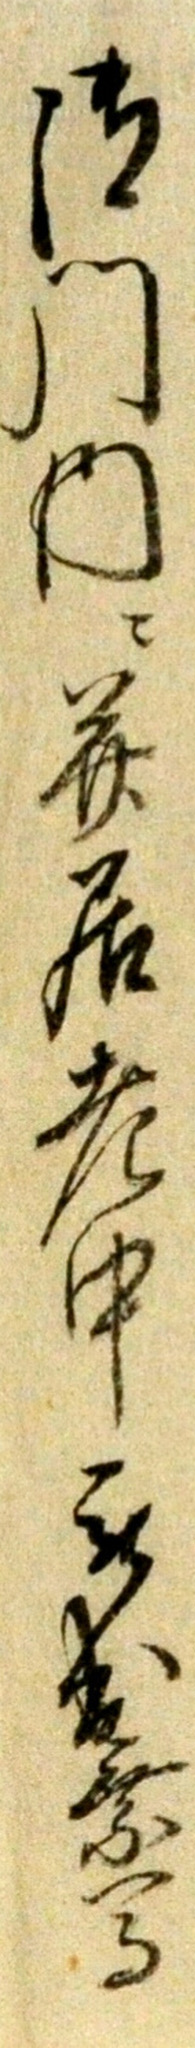御門内に并居老中被出乗馬
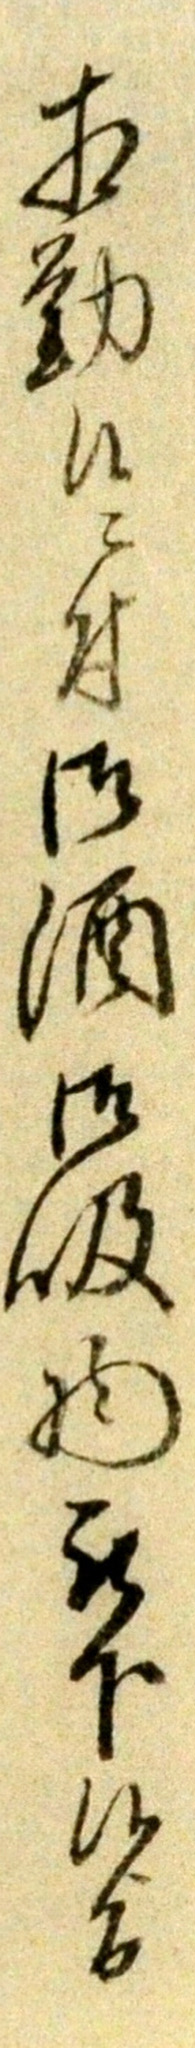相勤候に付御酒御吸物被下候旨
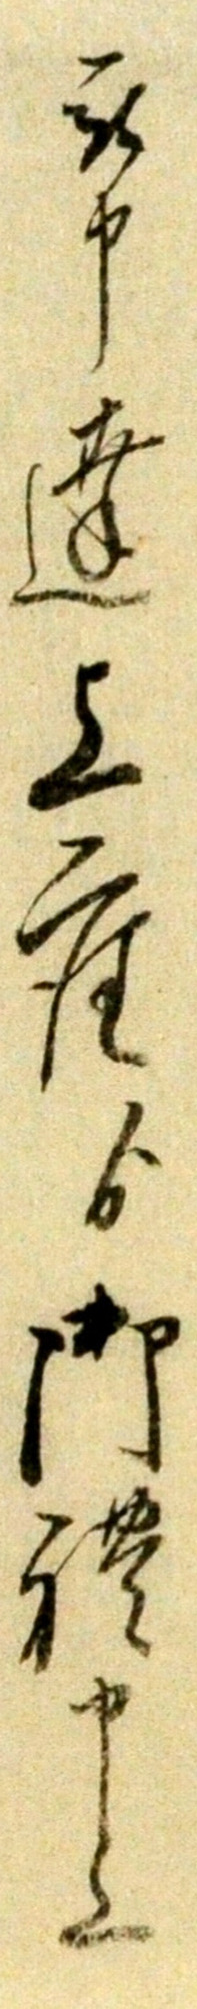被申達上座ゟ御礼申上
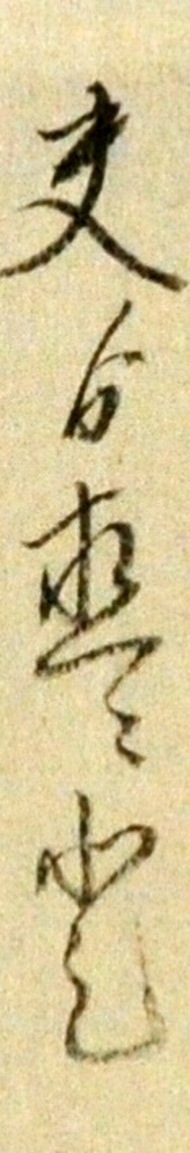夫ゟ直に登
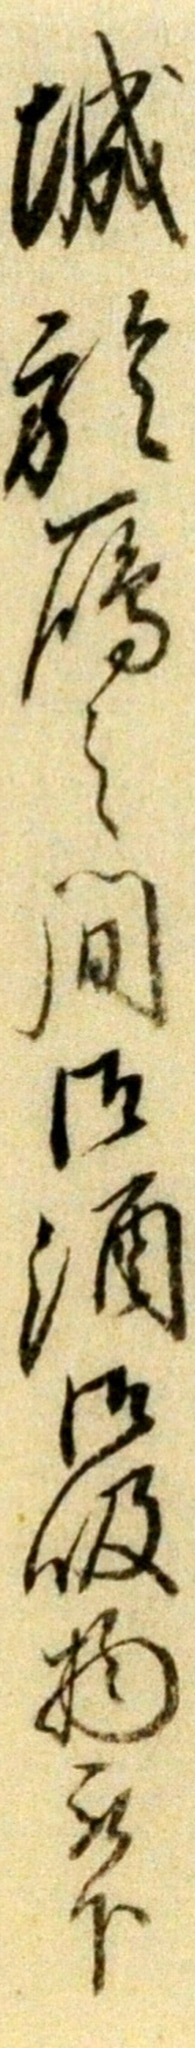城於雁之間御酒御吸物被下

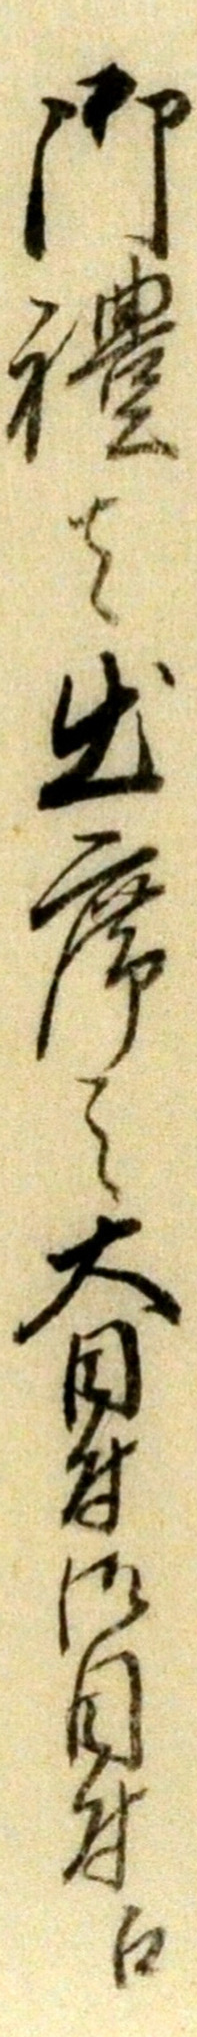御礼は出席之大目付御目付え
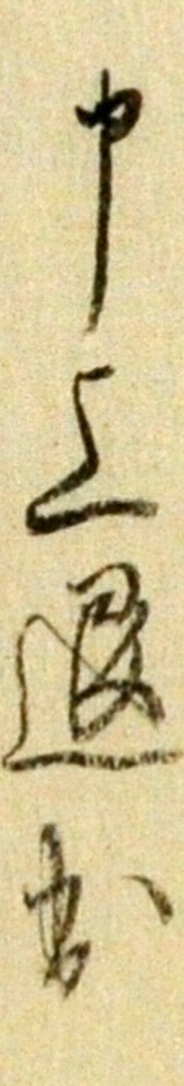申上退出
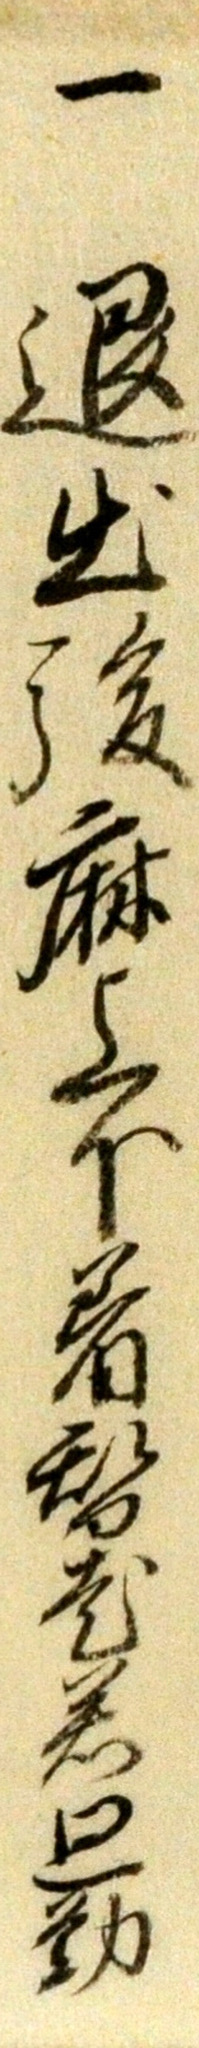一退出後麻上下着替老若廻勤
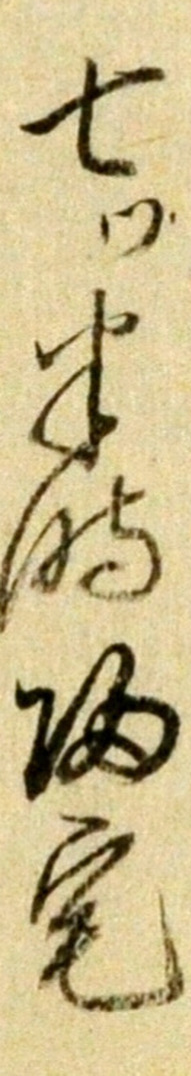七ツ半時帰宅

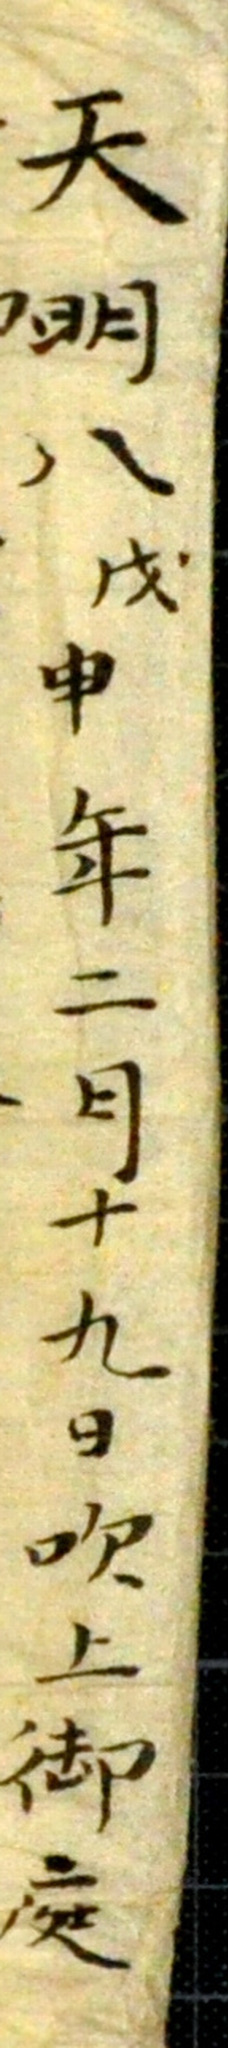天明八戊申年二月十九日吹上御庭
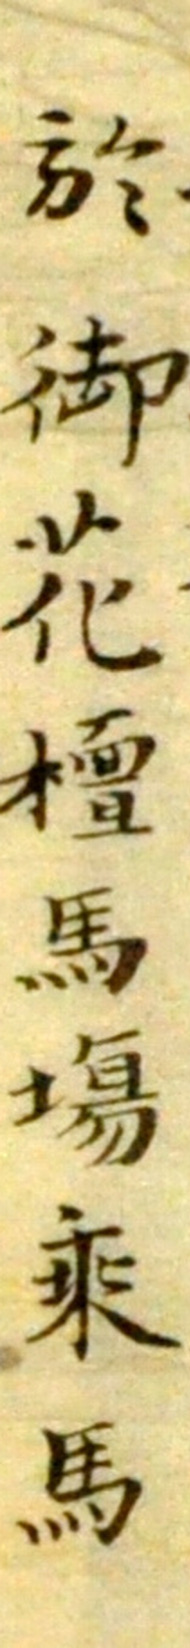於御花檀馬場乗馬
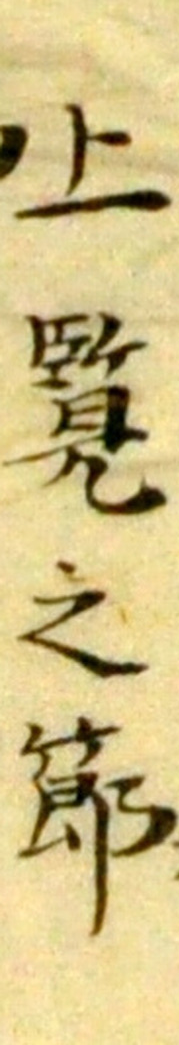上覧之節
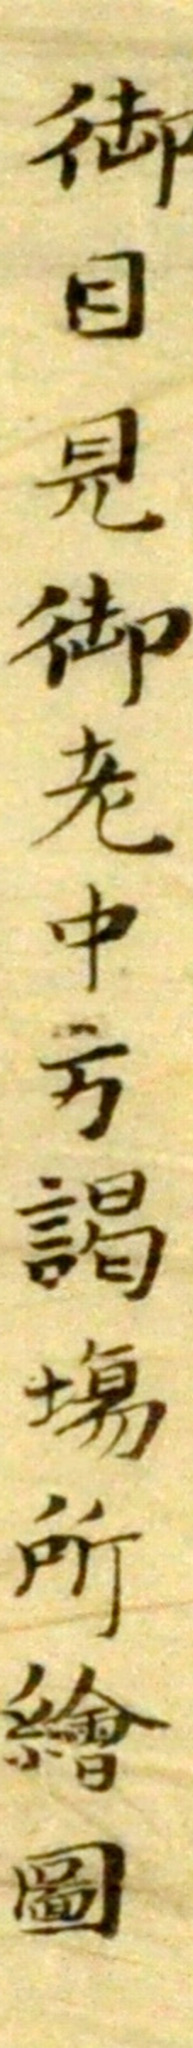御目見御老中方謁場所絵図
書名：吹上御庭ニ於テ乗馬上覧ノ節留書外
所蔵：伊那市立高遠町図書館・合同会社AMANE
